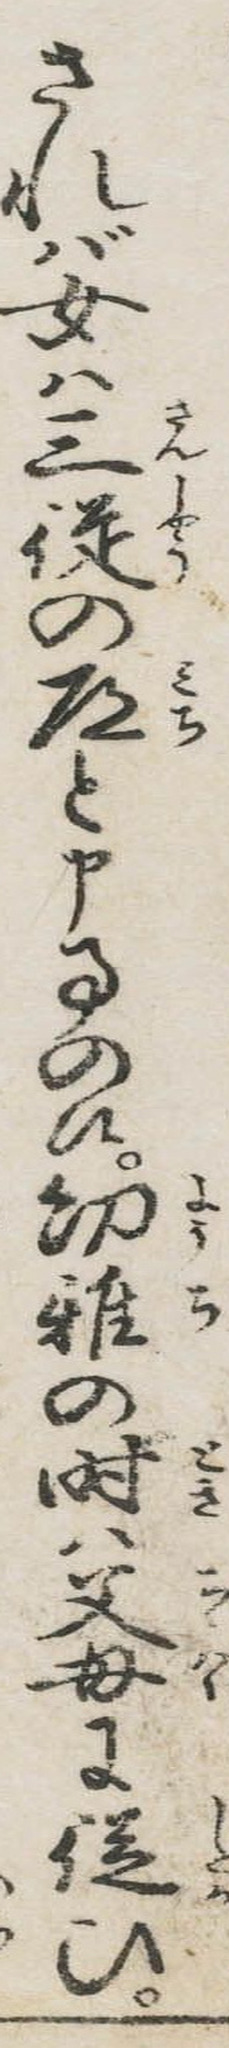されば女は三従の道と申事の候。幼稚の時は父母に随ひ。
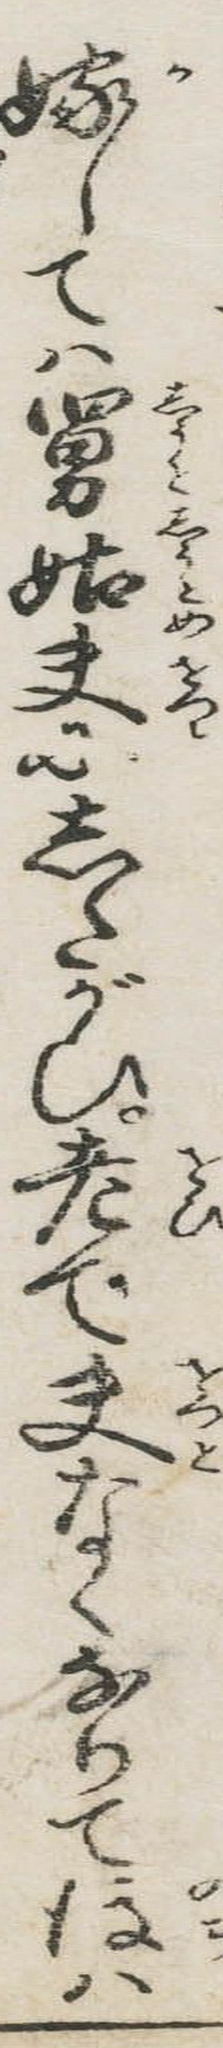嫁しては舅姑夫にしたがひ。老て夫なくなりて後は
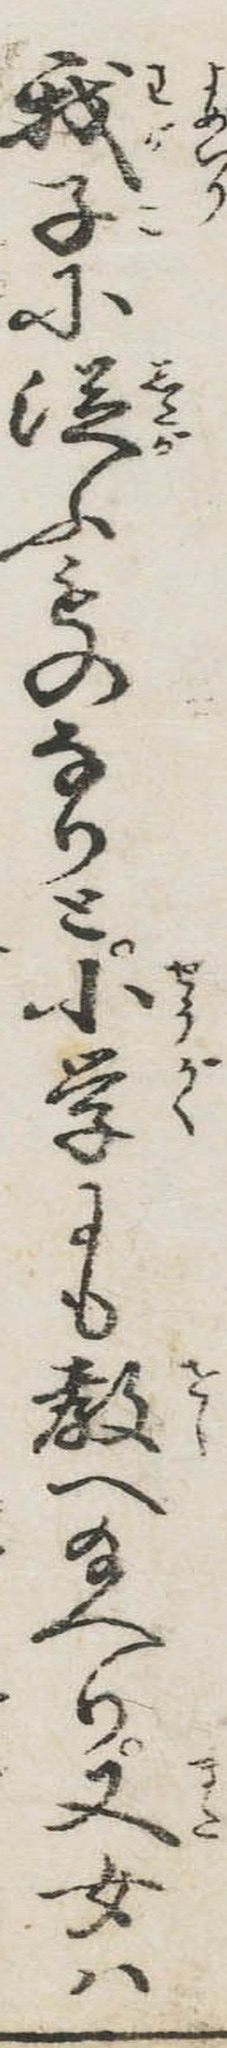我子に従ふものなりと。小学にも教へ給へり。又女は
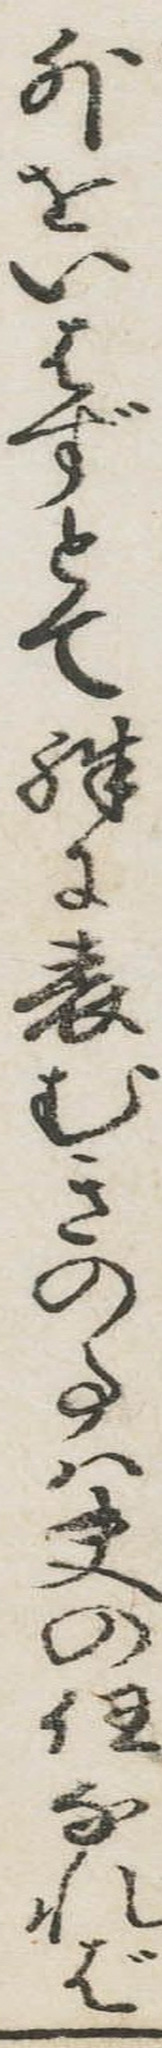外をいはずとて殊に表むきの事は夫の任なれば
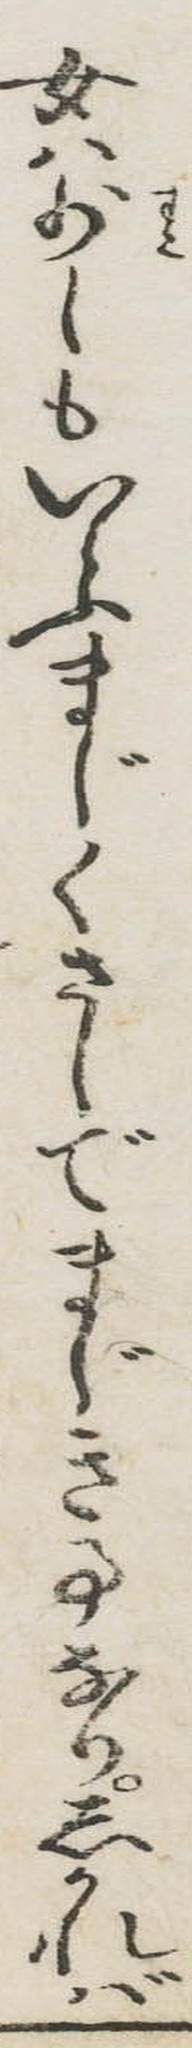女は少しもいふまじくさしでまじき事なり。しかれば
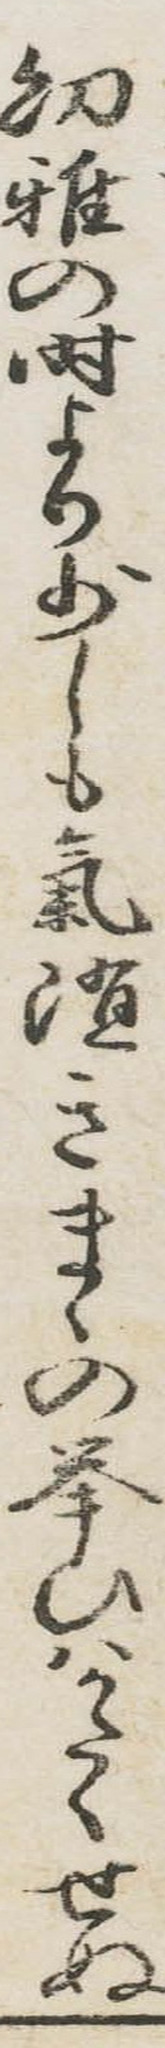幼稚の時より少しも気随きまゝの挙ひはかたくせぬ
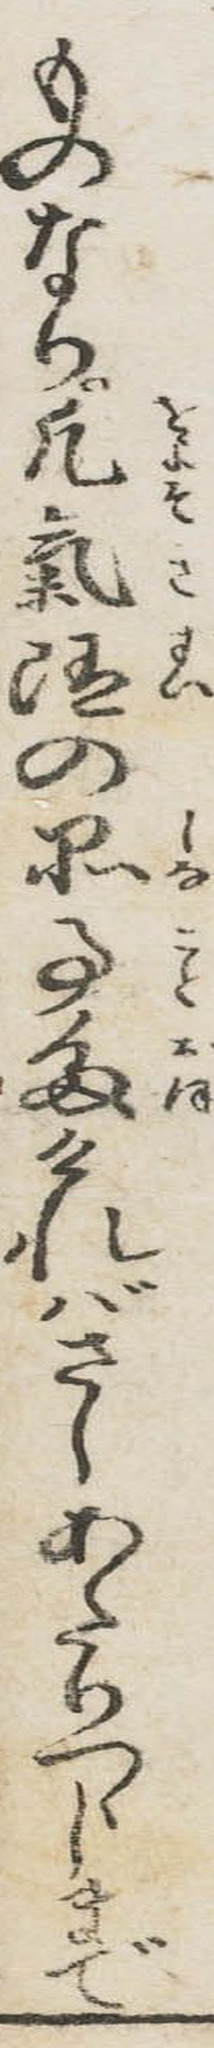ものなり。凡気随の品事多かればさしあたりつゝしまで
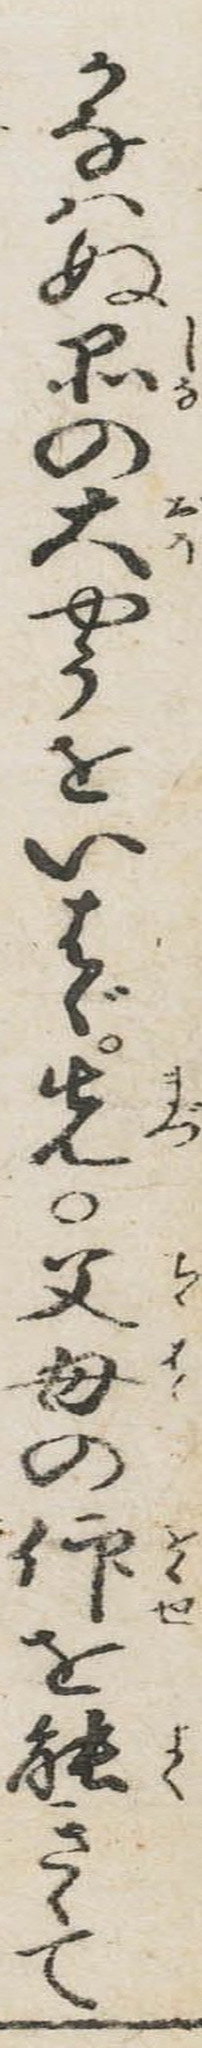かなはぬ品の大やうをいはゞ。先〇父母の仰を能きゝて
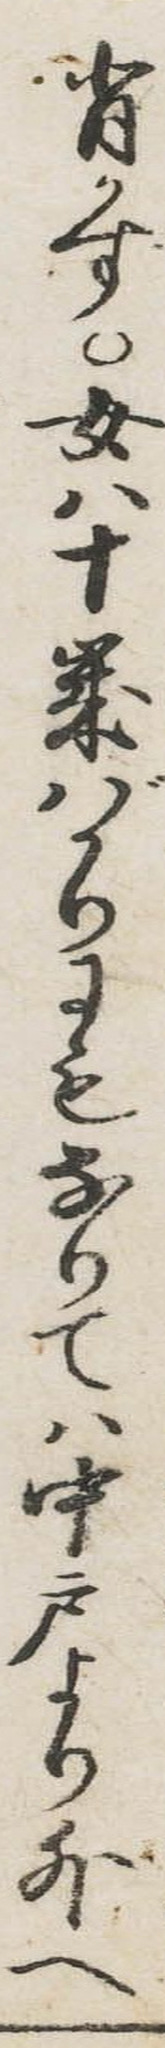背かず〇女は十歳ばかりにもなりては中戸より外へ
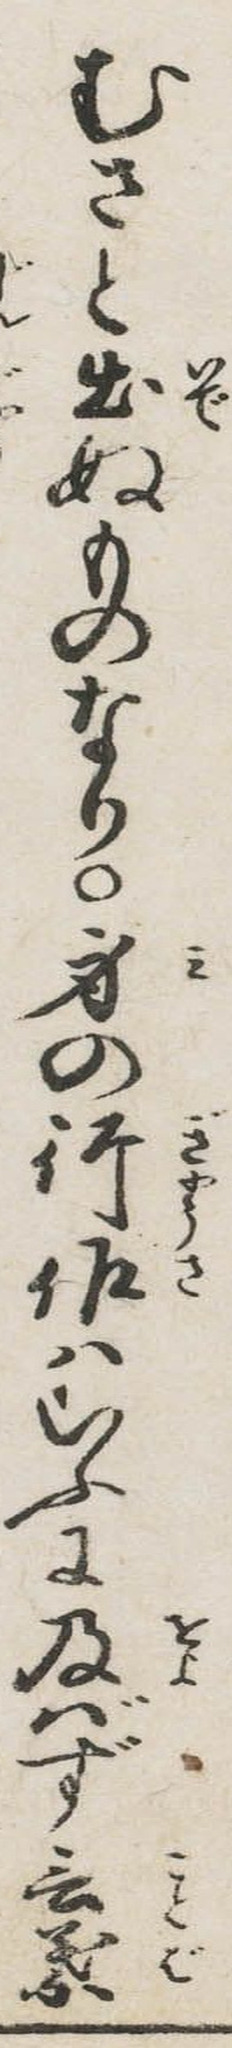むさと出ぬものなり○身の行佐はいふに及ばず言葉
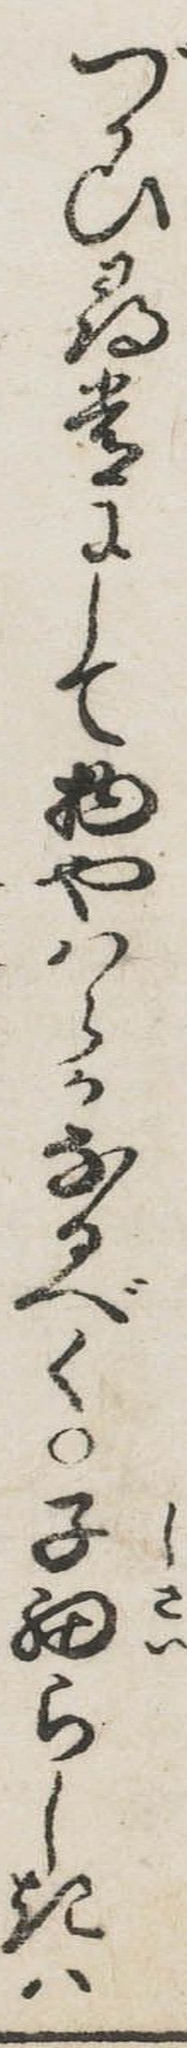づかひ尋常にしても物やはらかなるべく〇子細らしきは
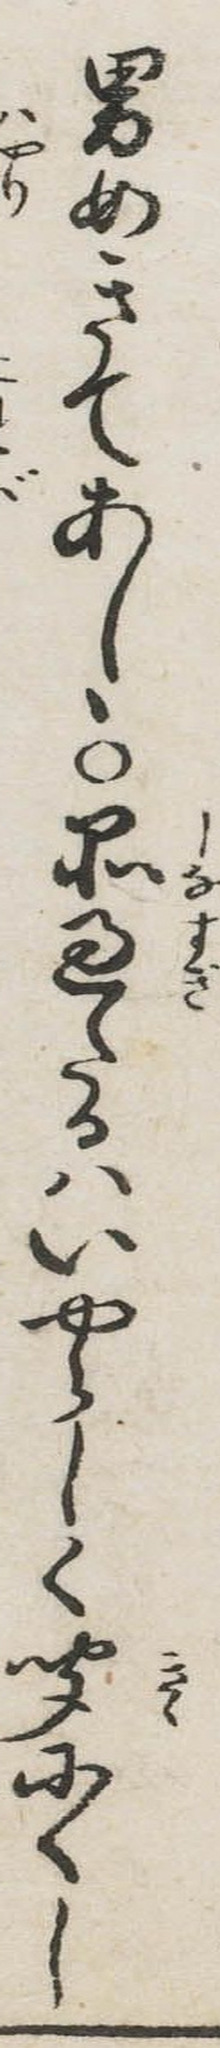男めきてあしゝ〇品過たるはいやらしく聞にくし
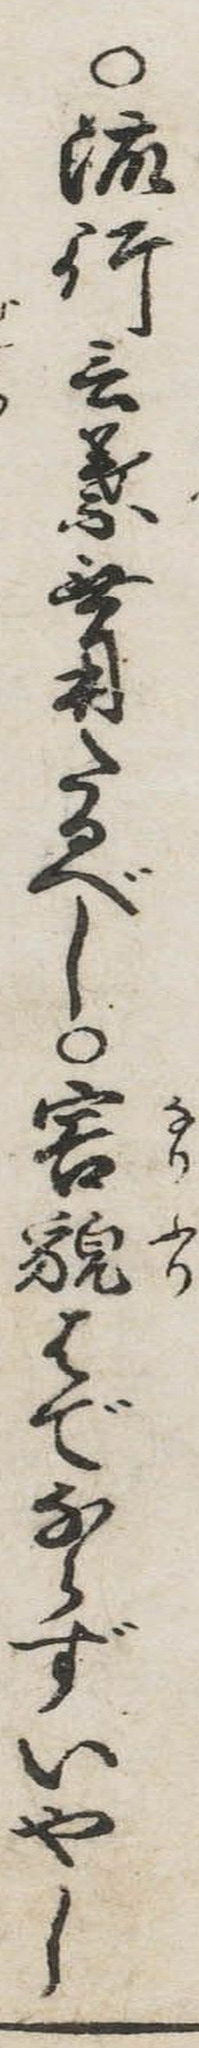〇流行言葉無用たるべし○容貌はでならずいやし
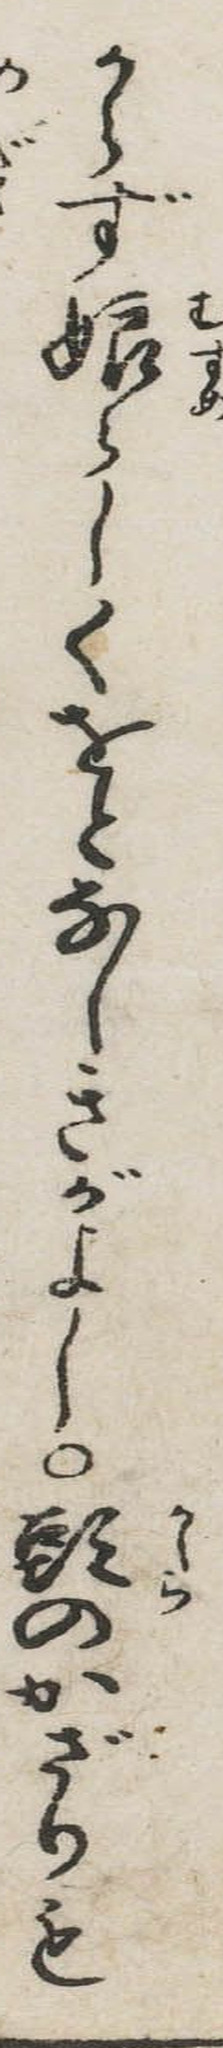からず娘らしくをとなしきがよし〇頭のかざりも
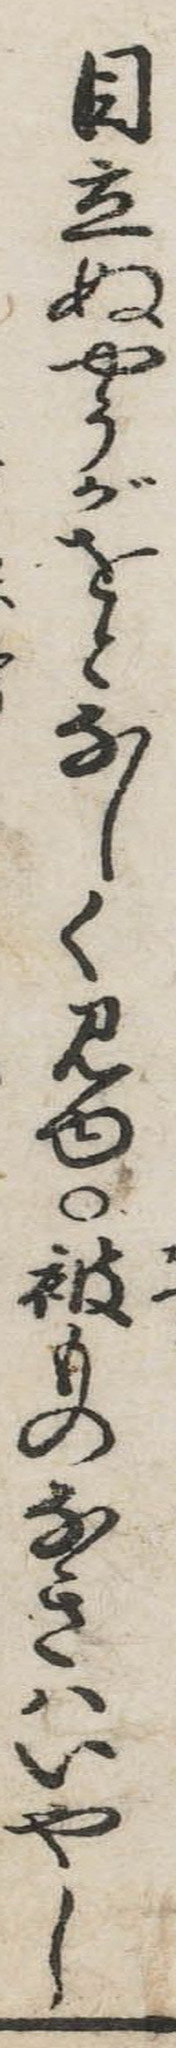目立ぬやうがをとなしく見ゆ〇被ものなきはいやし
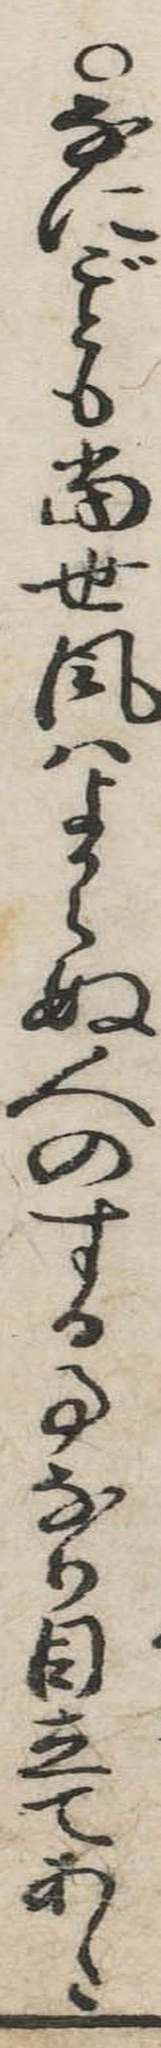〇なにごとも当世風はよからぬ人のする事なり目立てあしゝ
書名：前訓
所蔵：東京学芸大学附属図書館
